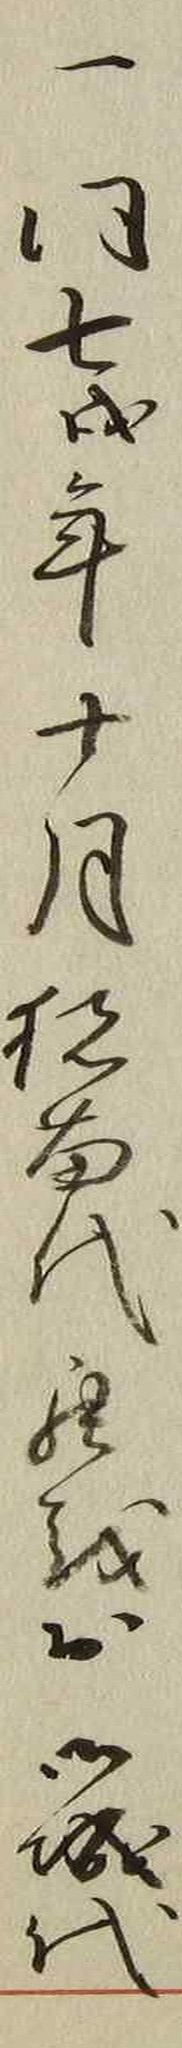一同七戌年十月猪苗代罷越於御城代
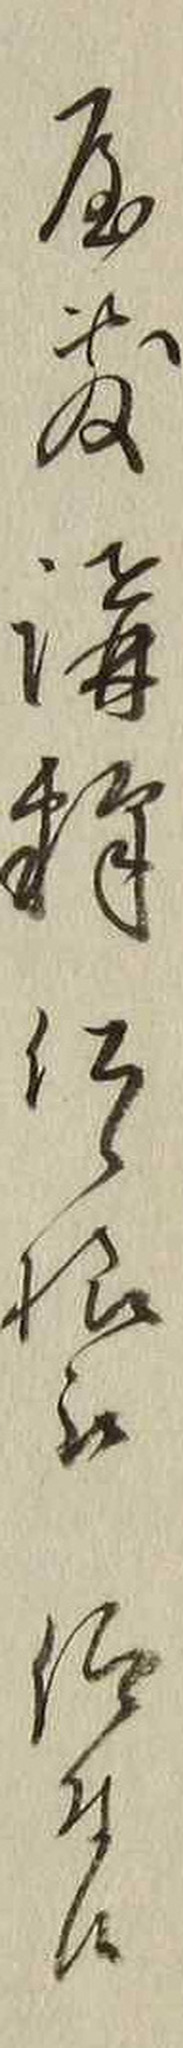屋敷講釈仕候様被仰付候
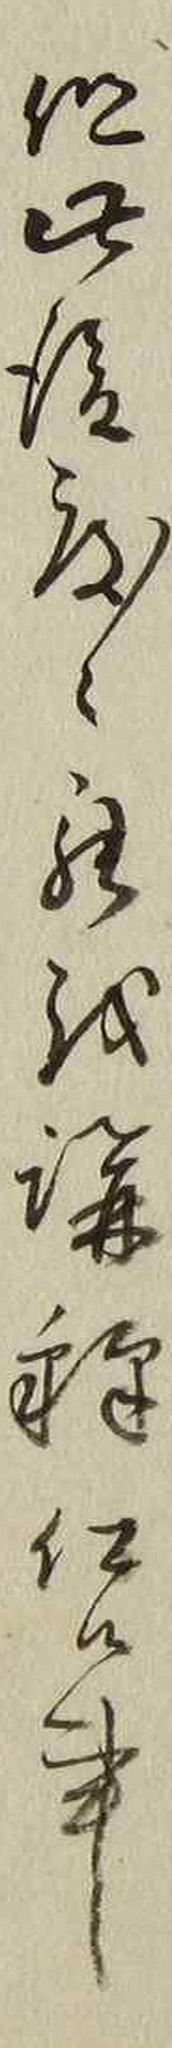但此後度々罷越講釈仕候事
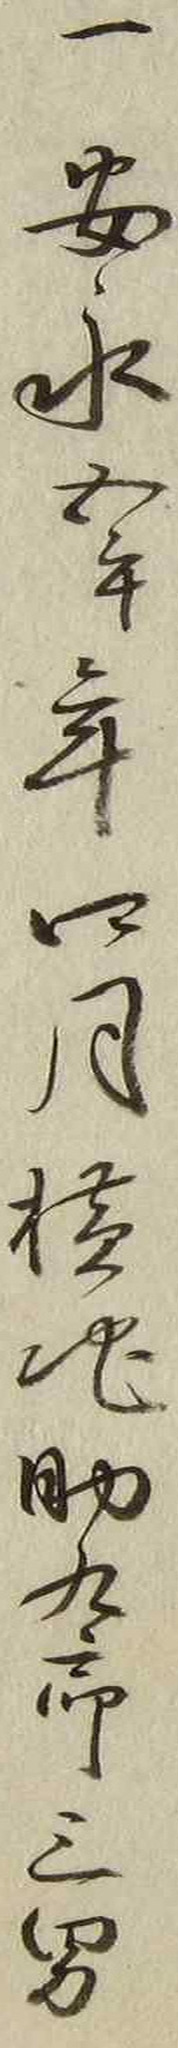一安永五午年四月横地助九郎三男
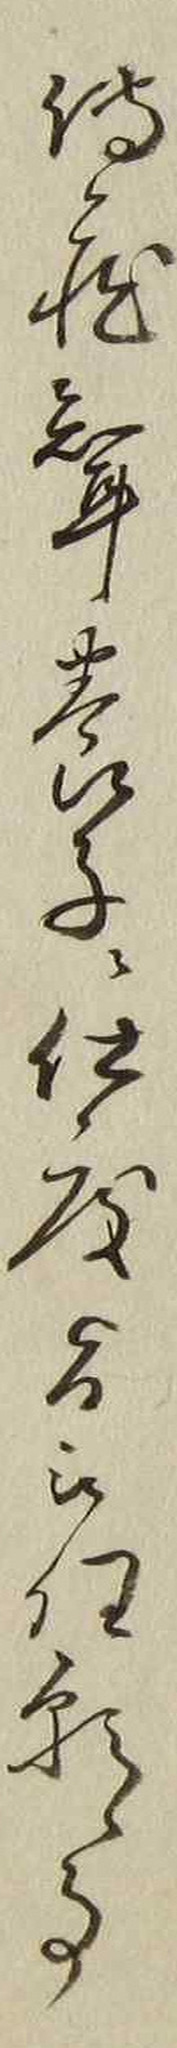伝蔵婿養子に仕度旨被任願候事
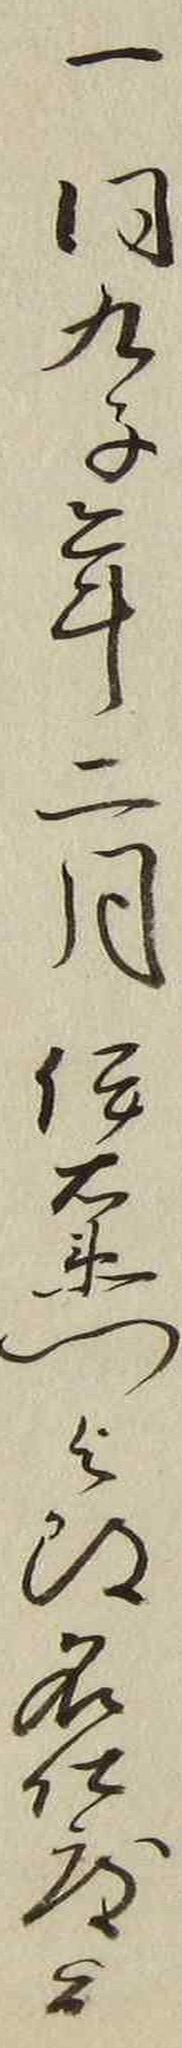一同九子年二月伊右衛門と改名仕度旨
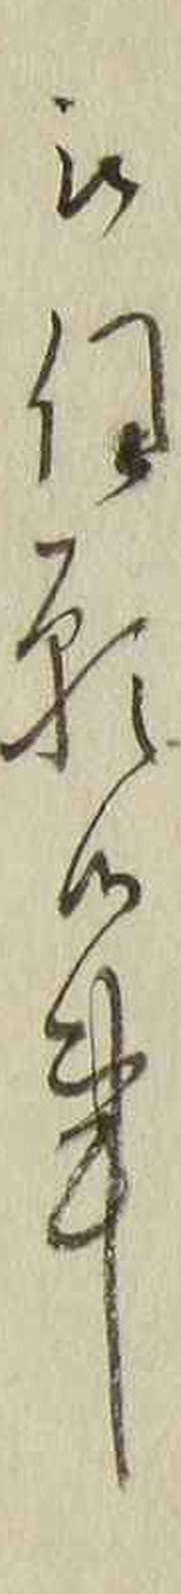被任願候事

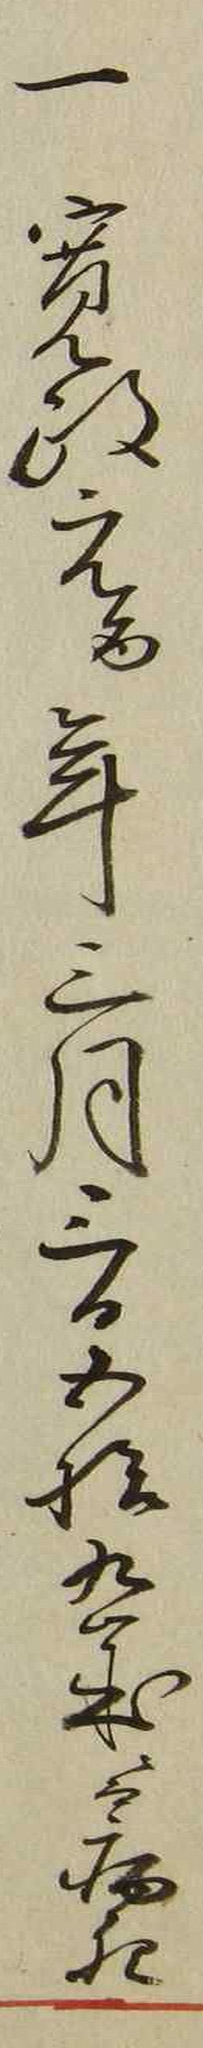一寛政元酉年三月三日五拾九歳に而病死
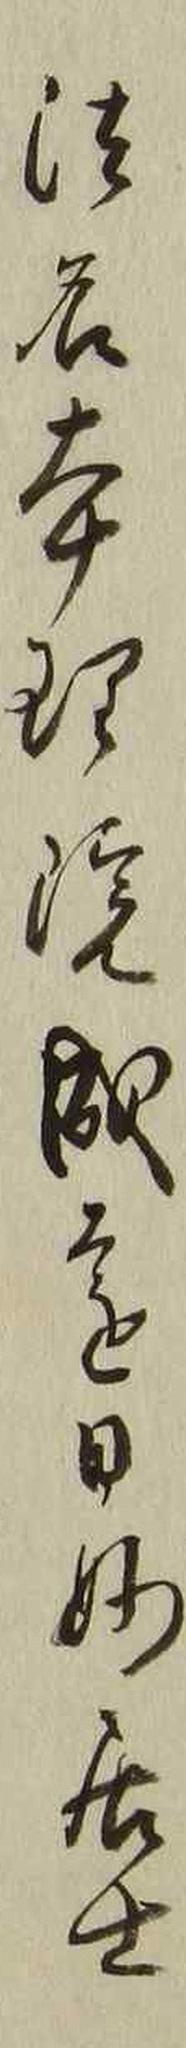法名本理院成道日妙居士
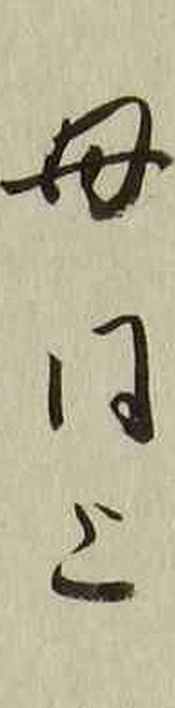母同上
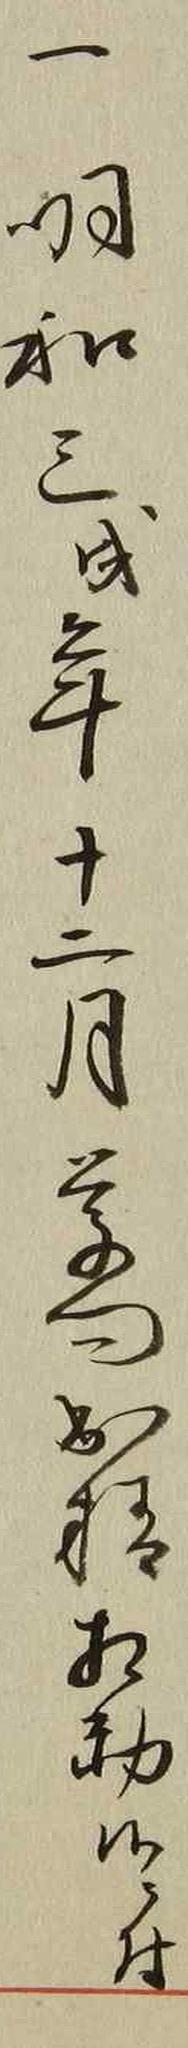一明和三戌年十二月学向出精相勤候に付
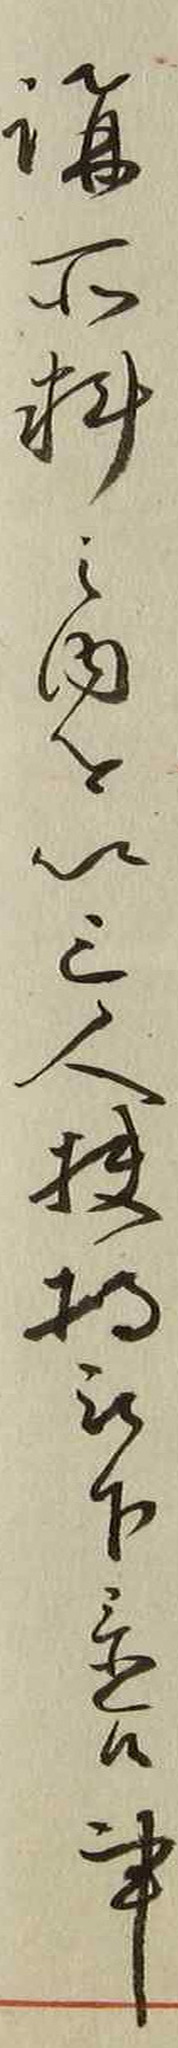講所料之内を以三人扶持被下置候事
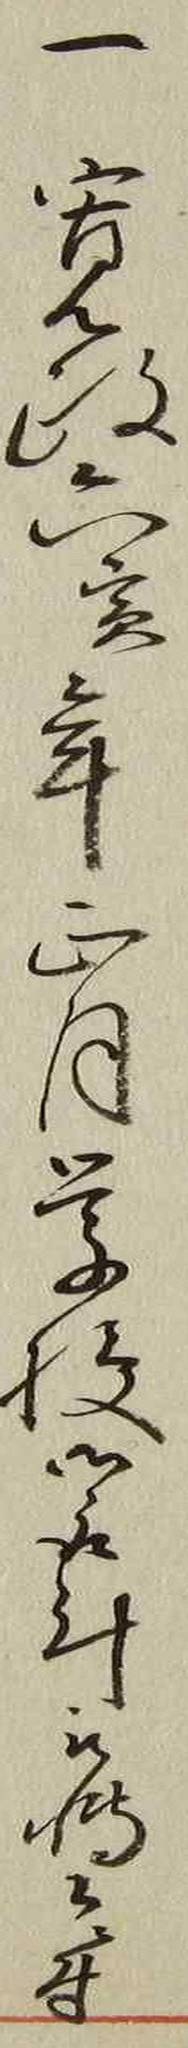一寛政六寅年正月学校御取計被転候に付
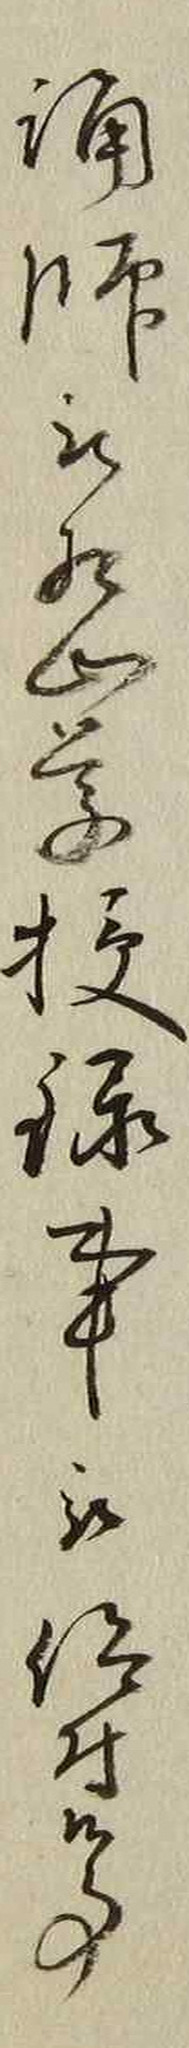誦師被相止学校録事被仰付候事
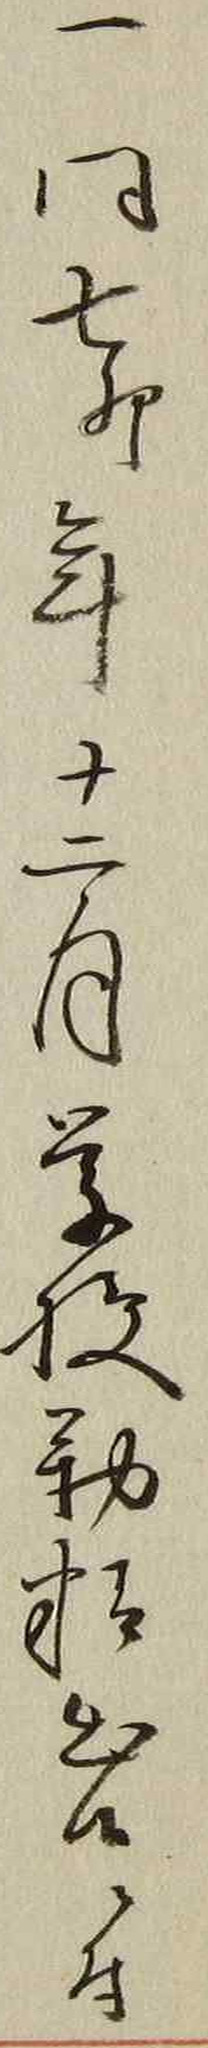一同七卯年十二月学校勤精出候に付
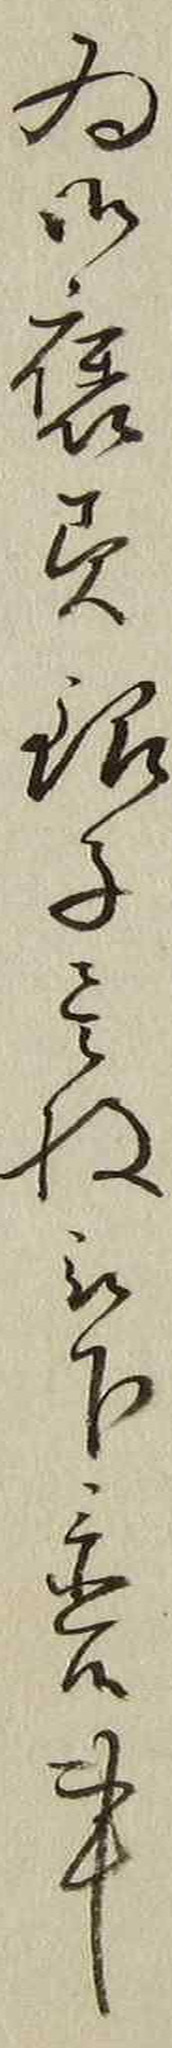為御褒美銀子壱枚被下置候事
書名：諸士系譜　巻之3　い之部3
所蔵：会津若松市立会津図書館
